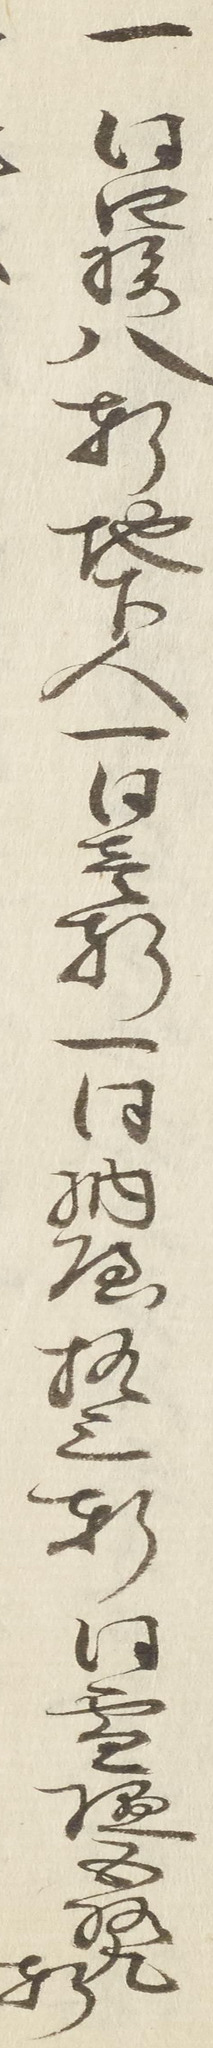一同四拾八軒地下人一同壱軒一同納屋拾三軒同雪隠五拾九軒
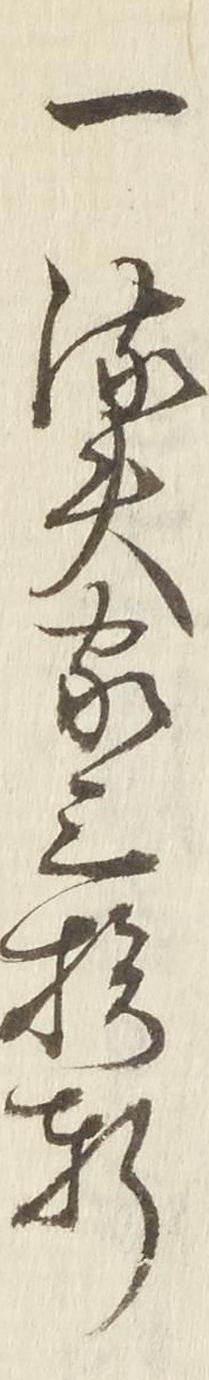一流失家三拾軒
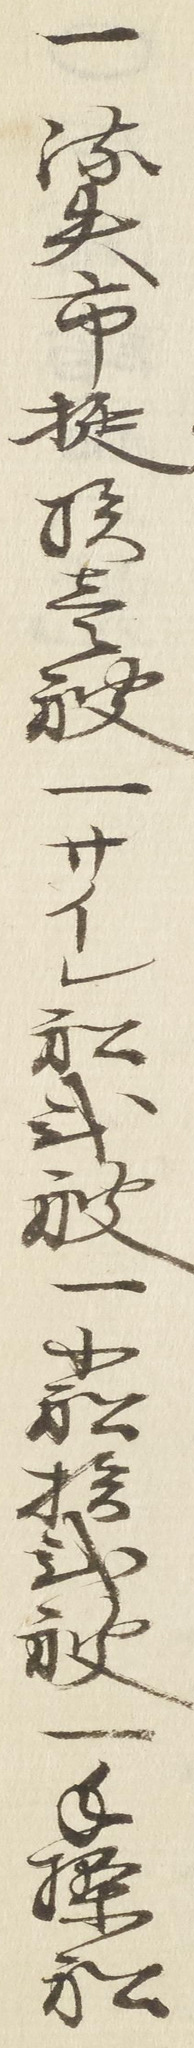一流失市艇拾壱艘一サイㇾ船弐艘一小船拾弐艘一手操船
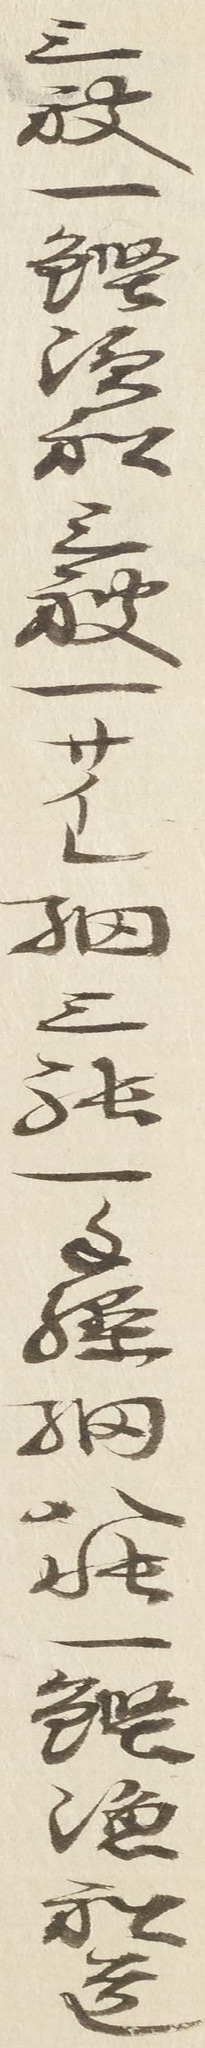三艘一鰹漁船三艘一サイㇾ網三張一手繰網八張一鰹漁船道
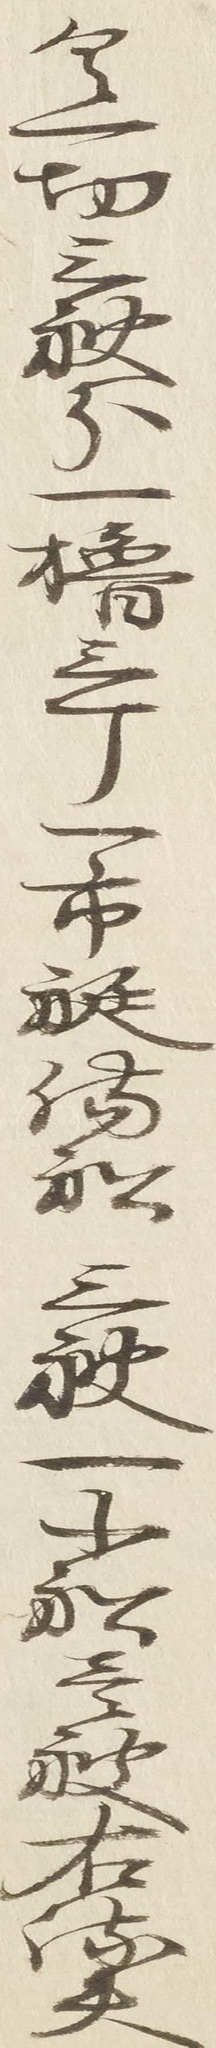具一切三艘分一檣三丁一市艇傷船三艘一小船壱艘右流失
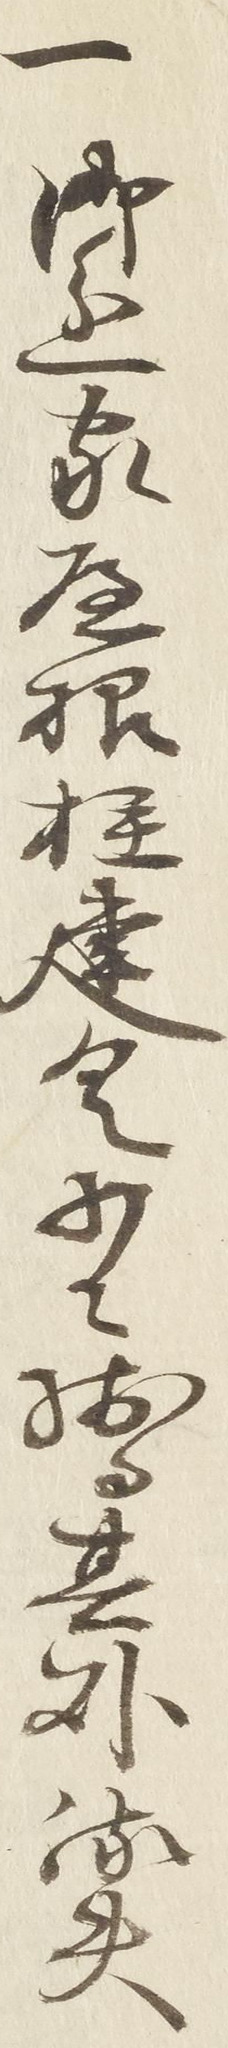一御分一家屋根柱建具少々残る其外流失
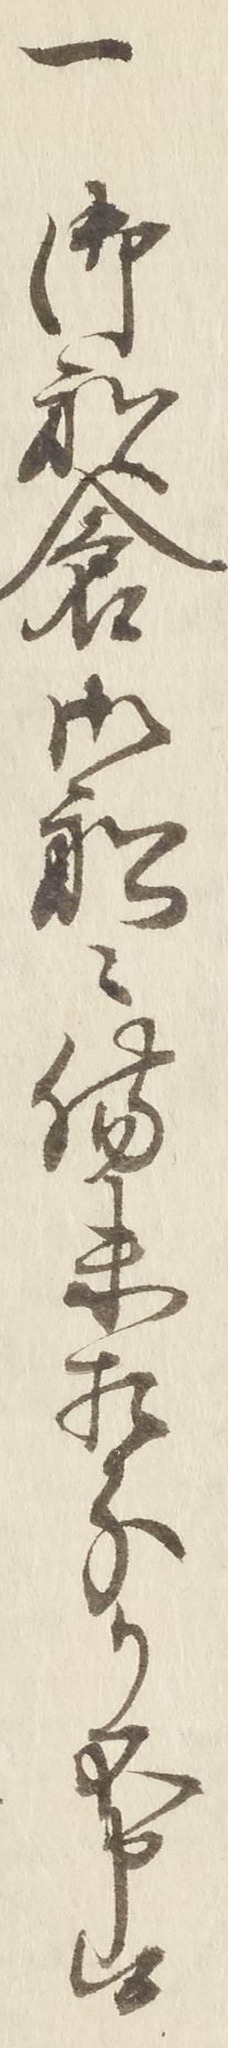一御船倉御船々傷未相分り不申候
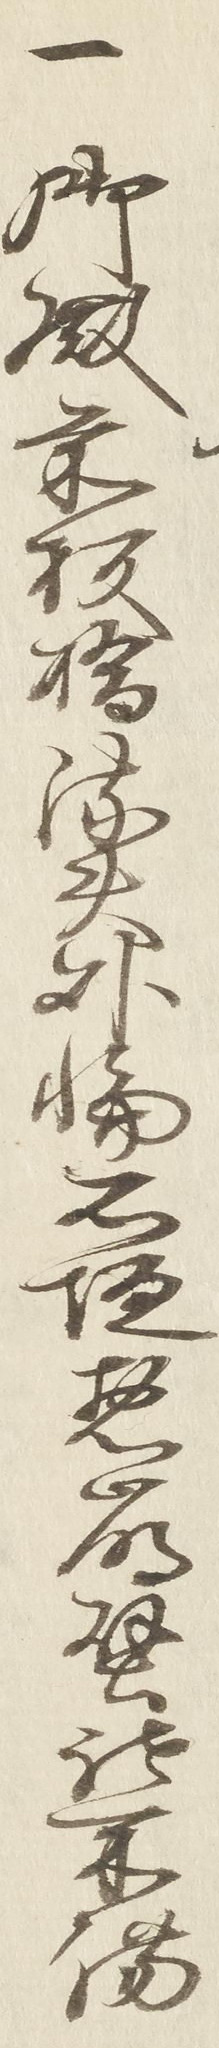一御殿前板橋流失外輪石垣惣崩壁諸所傷
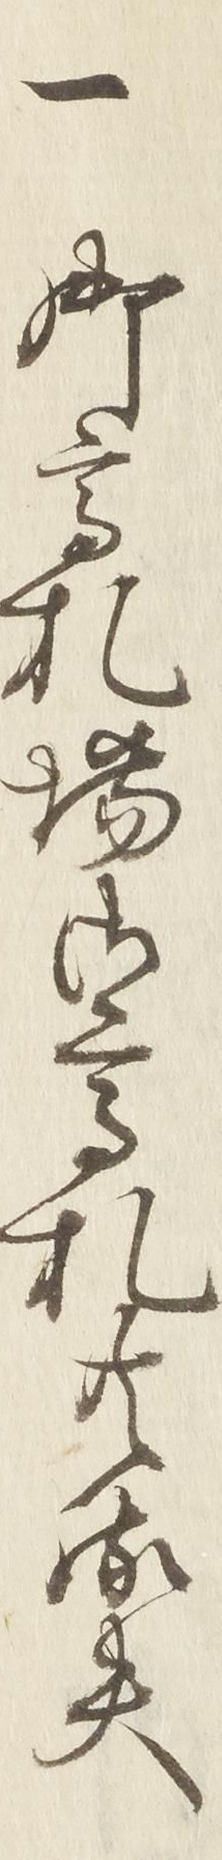一御高札場御高札共流失
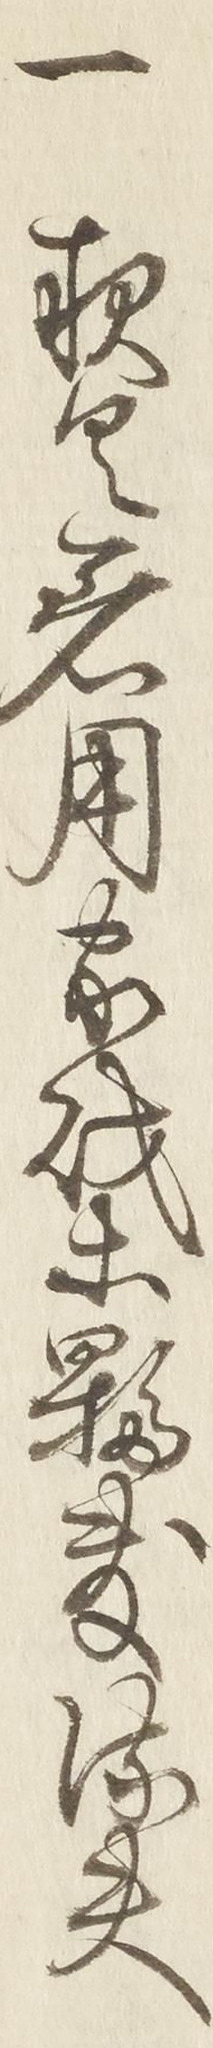一夜具着用家財等夥敷流失
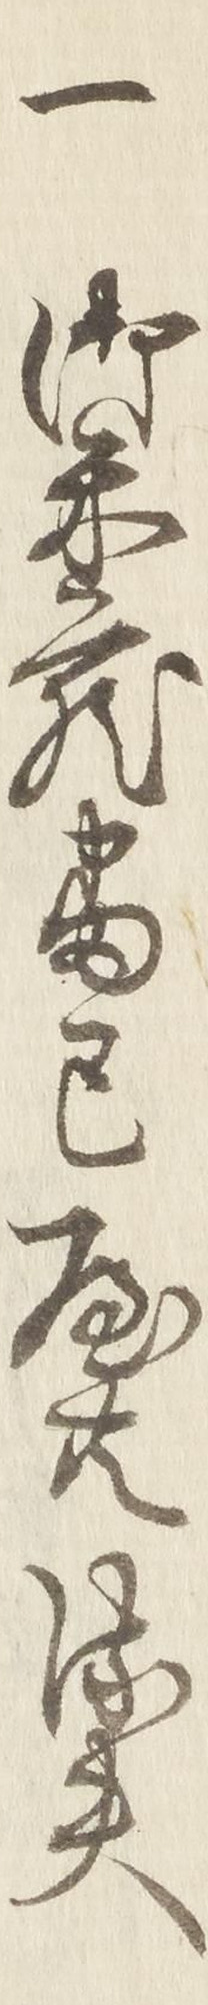一御米蔵番已屋共流失
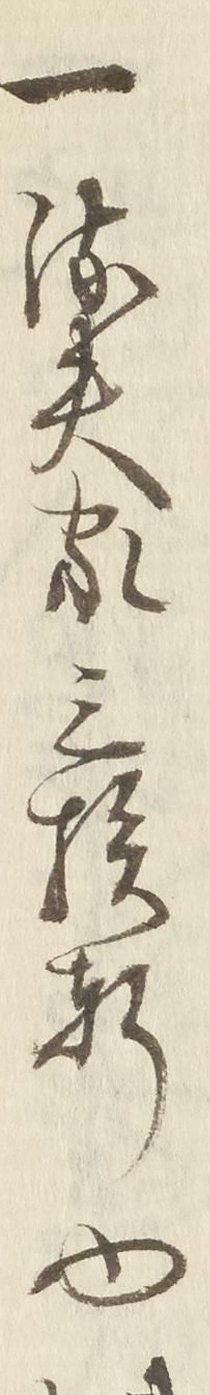一流失家三拾軒

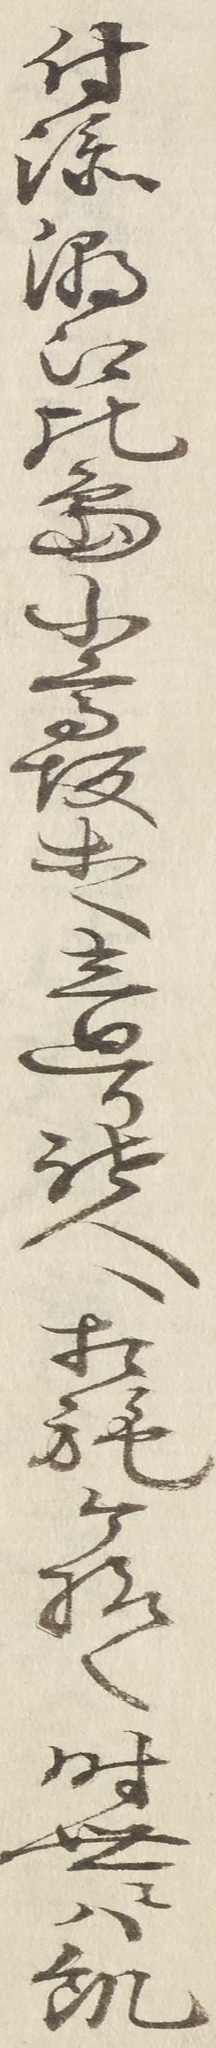付添潮江比嶋小高坂等へ立廻り諸人へ相施ヶ様之時世には飢
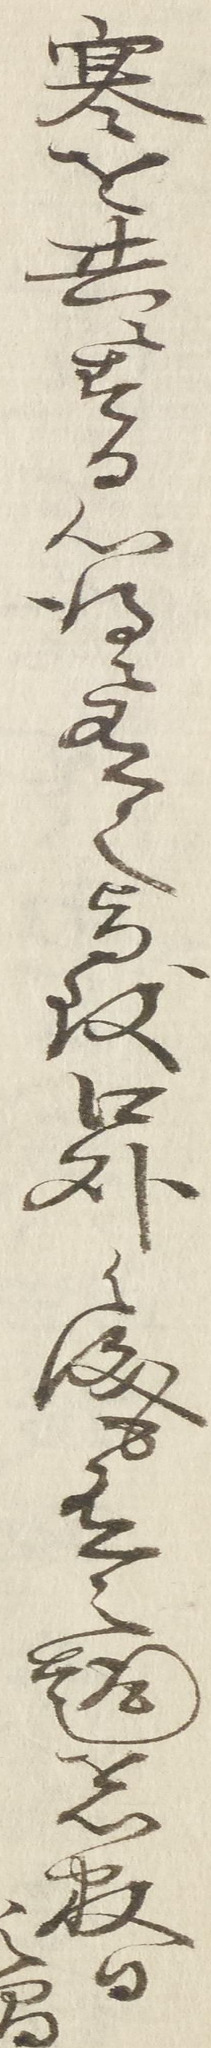寒を共にする心得に有之旨致口外之儀に有之趣を以数日之間
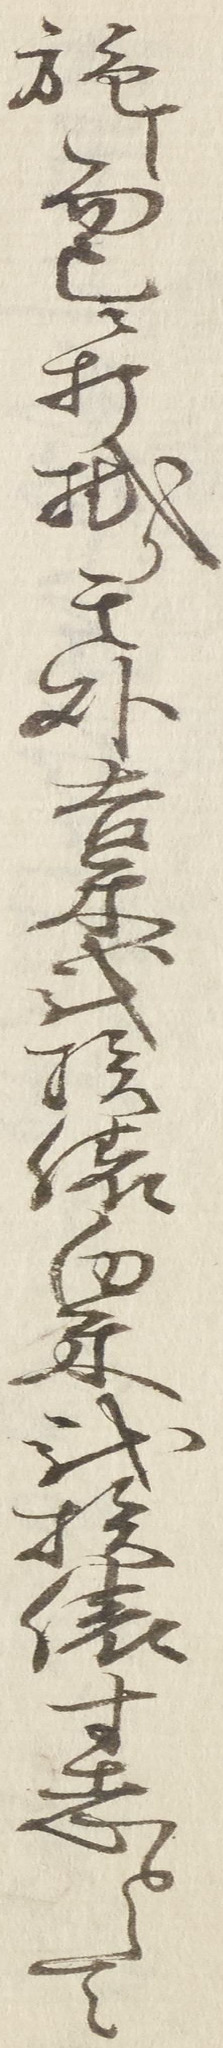施し而巳に打掛り其外吉米弐拾俵白米弐拾俵寸志として
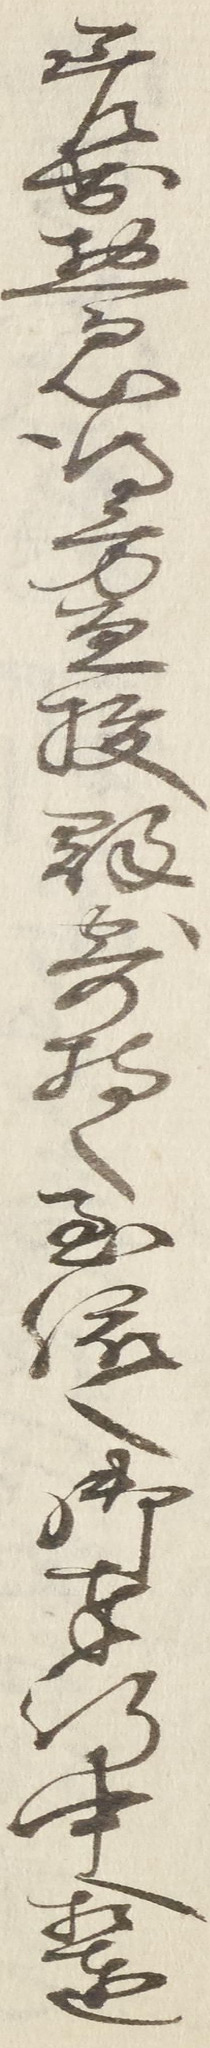差出惣而心得方至援弱奇特之至依之御奉行中へ相達
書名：地震記　下
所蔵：東京大学地震研究所図書室 Earthquake Research Institute Library, The University of Tokyo, JAPAN
